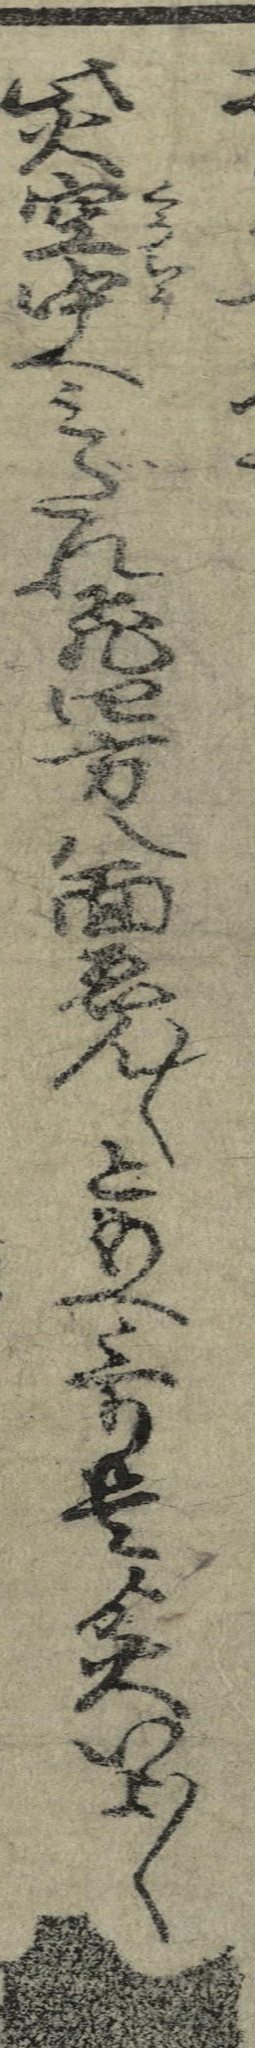此火空中へミだれ飛四方八面ゑん〳〵ともへふり是ゟ火いよ〳〵
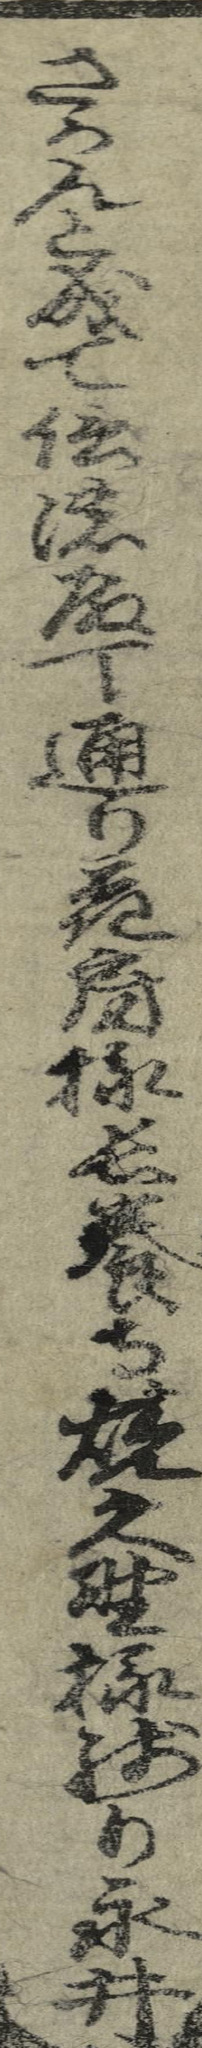さかんと成て信濃殿丁通り花房様長養寺焼久野様残り永井
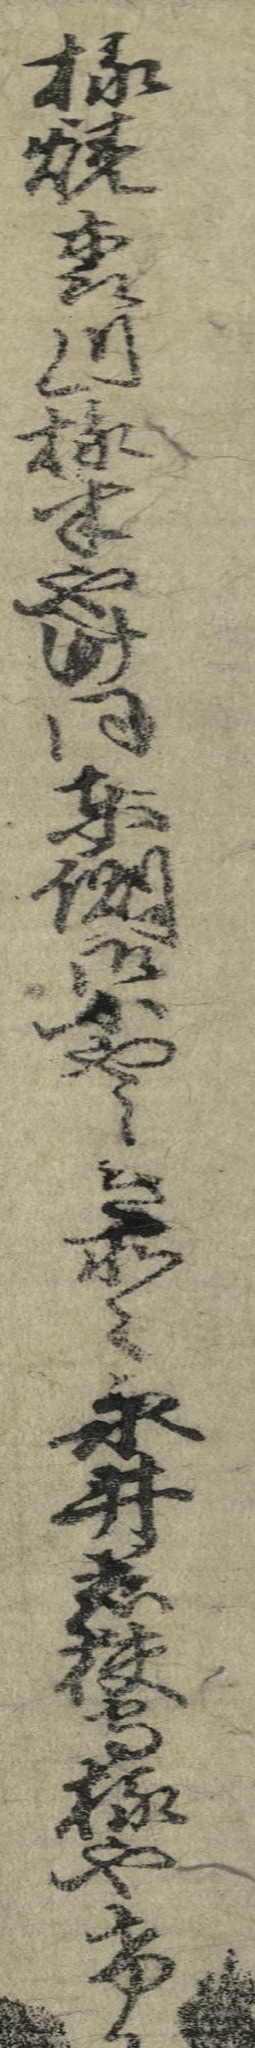様焼森川様半やけ同東側御小やしき所々永井若狭守様やける
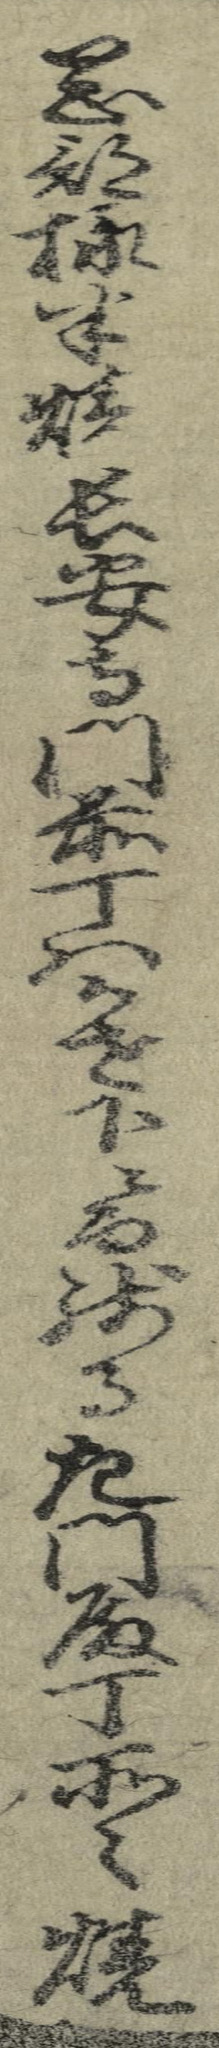岡部様半焼長安寺門前丁ハかけ下二而残る左門殿丁所々焼
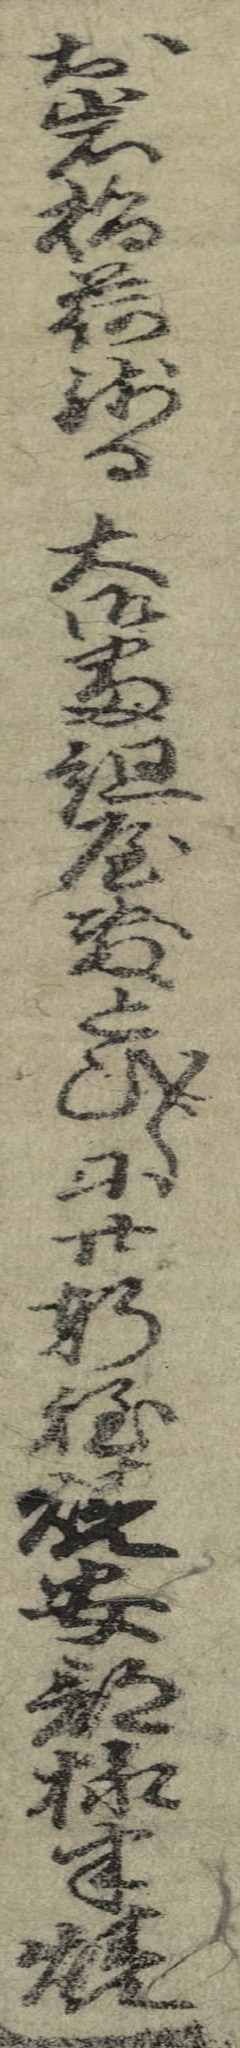お岩稲荷残る大御番組屋敷とび〳〵に廿軒程焼阿部様半焼
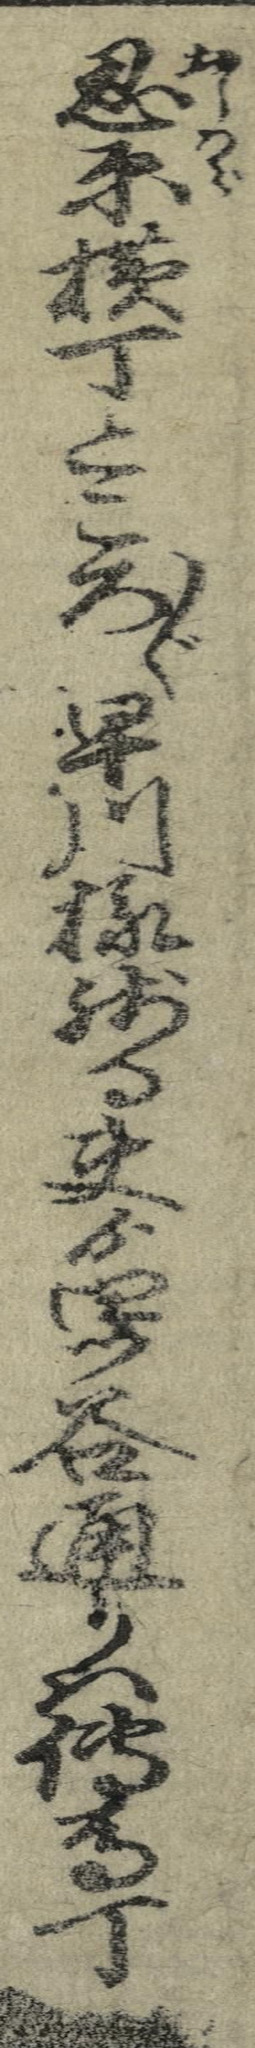忍原横丁ところ〴〵早川様残る夫ゟ四ッ谷通りハ伝馬丁
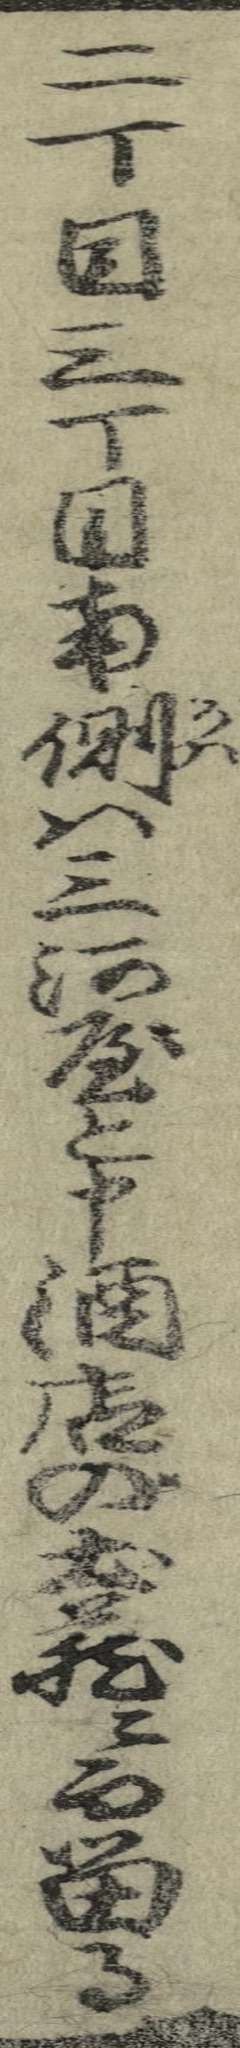二丁目三丁目南側ハ三河屋と申酒店のなか程二而留る
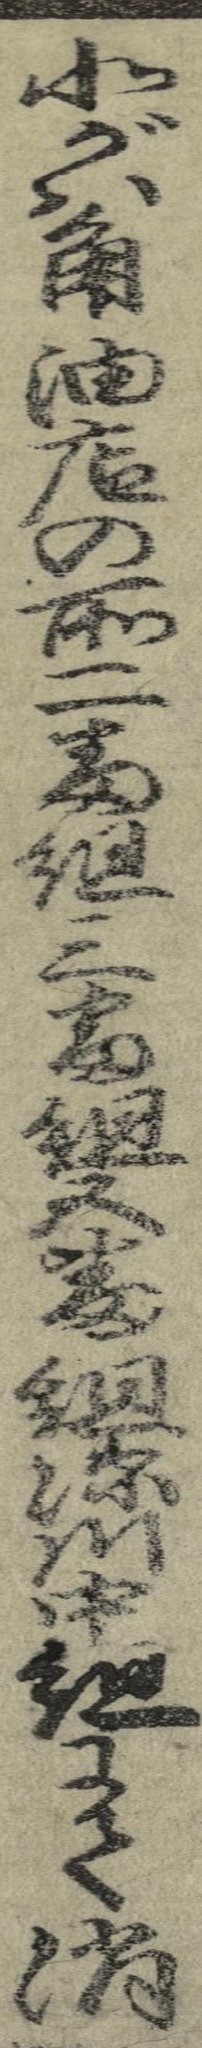北がハ角油店の所二番組三番組五番組深川中組にて消
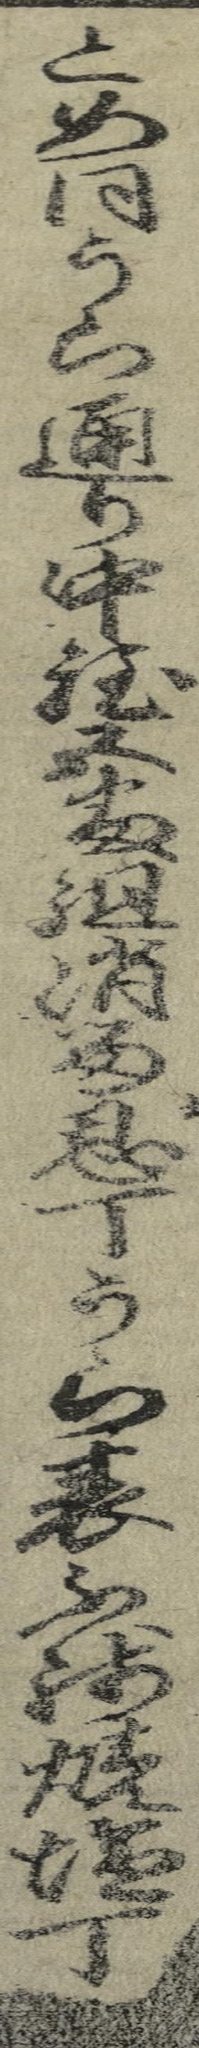とめ同うら通り中程五番組消留忍丁うら表不残焼塩丁
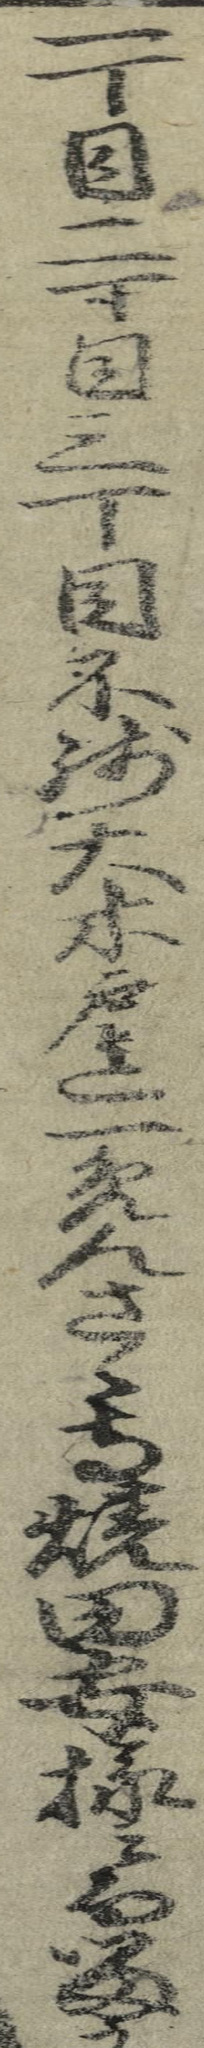一丁目二丁目三丁目不残大木戸迄一めんさゝ寺焼田安様二而留る
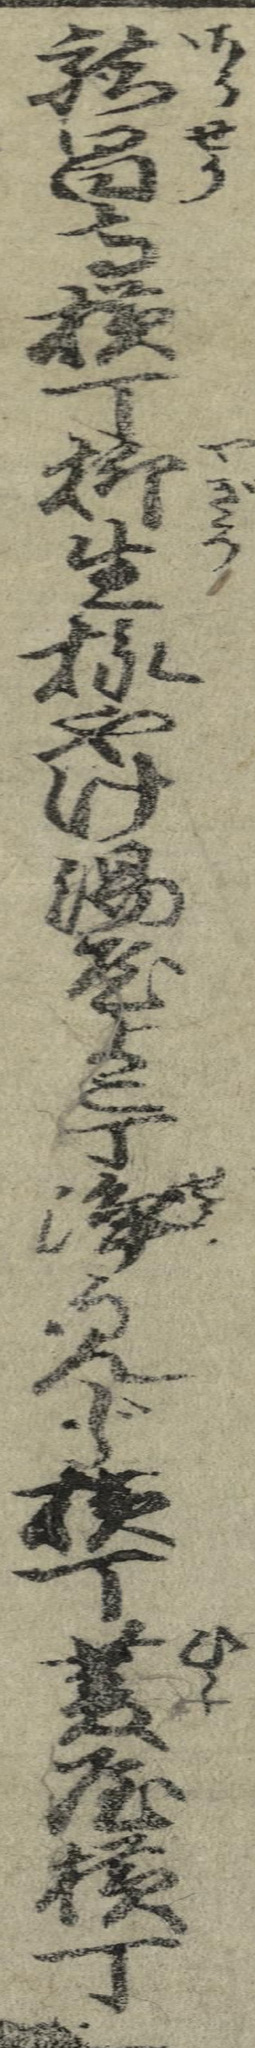龍昌寺横丁柳生様やけ湯屋よこ丁淨うんじ横丁菱屋横丁
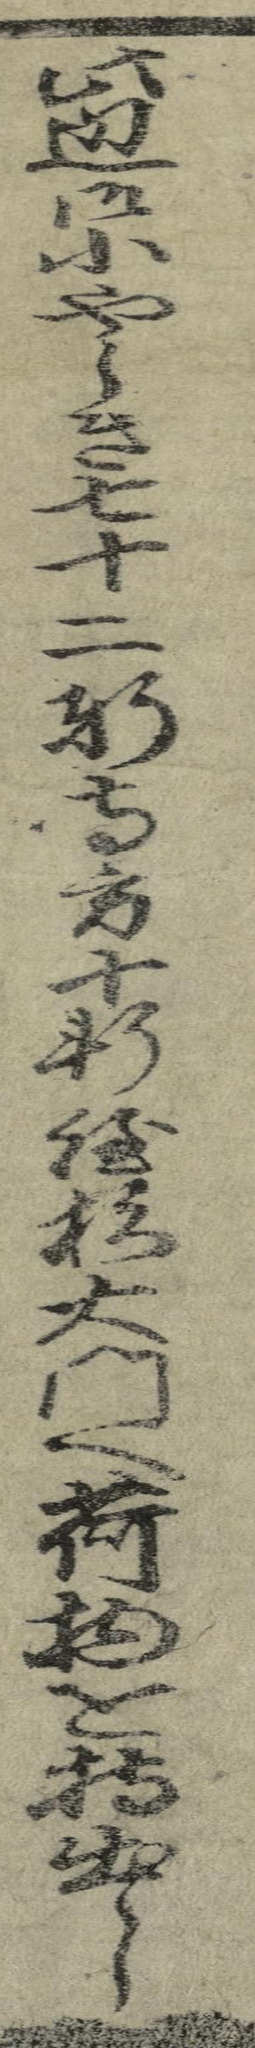此辺御小やしき七十二軒寺方十軒程橋大門へ荷物を持出し
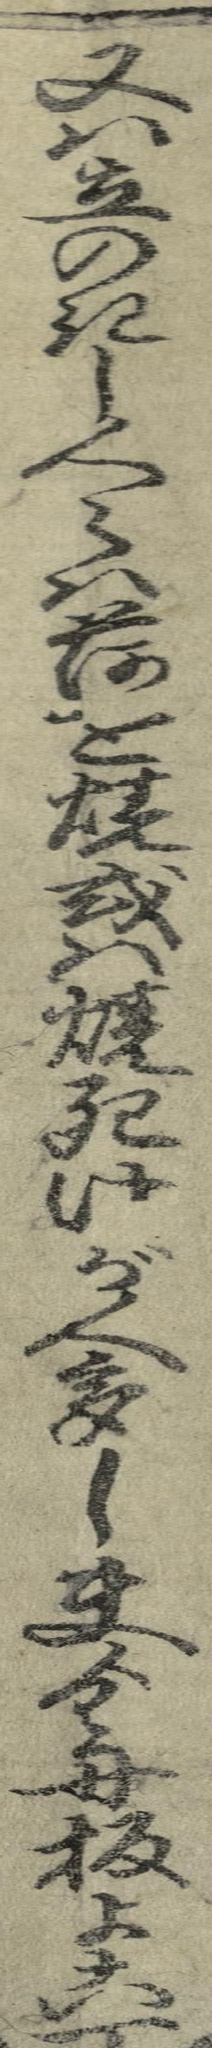又ハ立のきし人〻ハ荷を焼或ハ焼死けが人多し夫ゟ舟板よこ丁
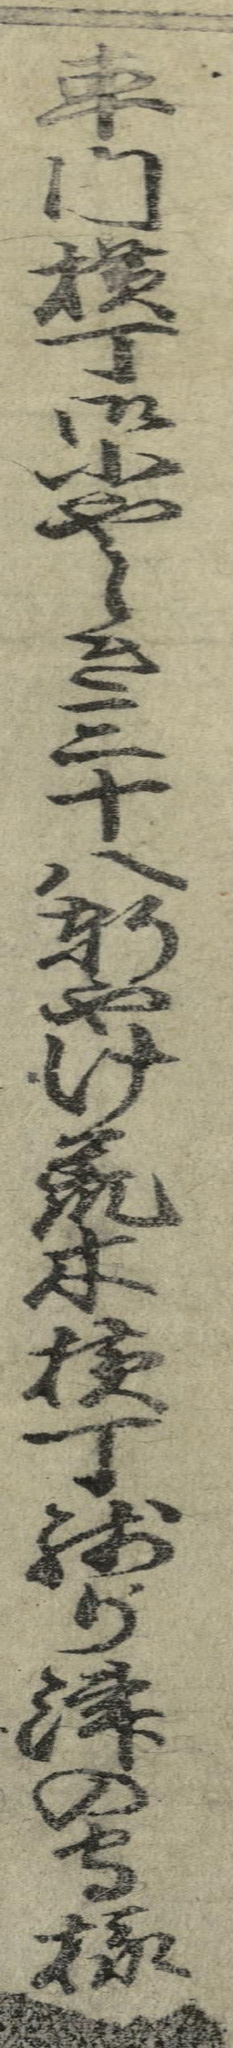車門横丁御小やしき三十八軒やけ荒木横丁残り津の守様
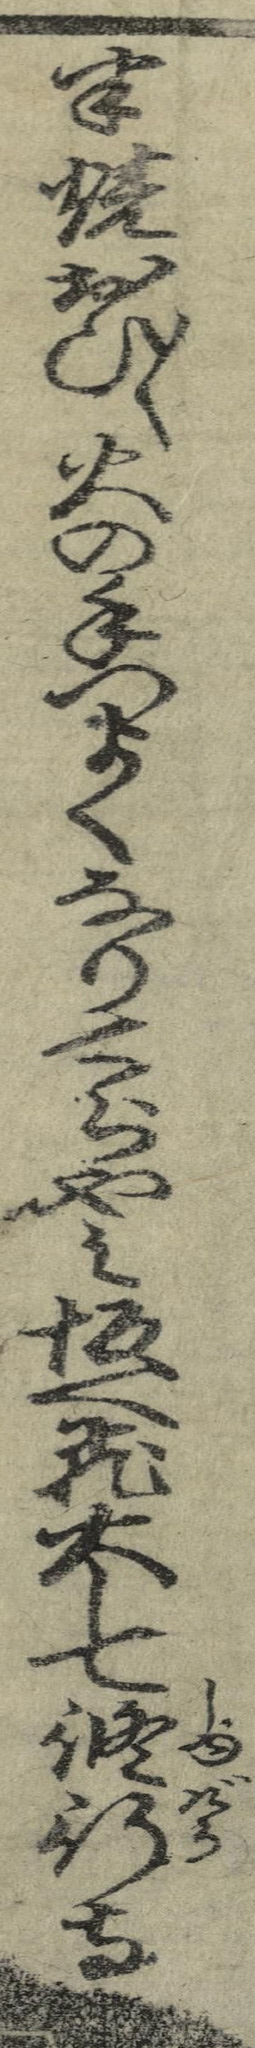半焼おひ〳〵火の手つよくなりくらやミ坂へ飛火して修行寺
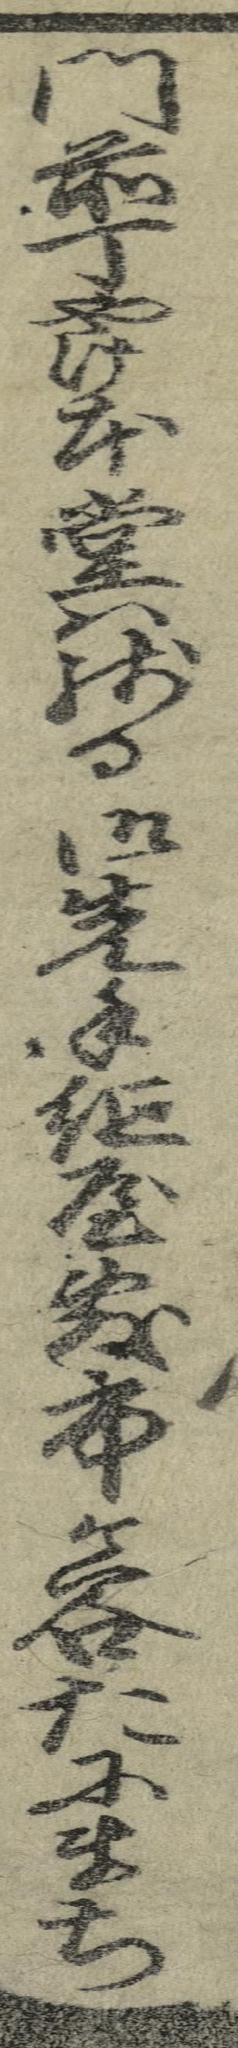門前丁やけ本堂ハ残る御先手組屋敷市ヶ谷たにまち
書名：安政六未歳二月廿一日青山大火場所附
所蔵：東京大学地震研究所図書室 Earthquake Research Institute Library, The University of Tokyo, JAPAN
